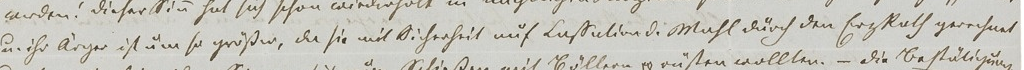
u. ihr Ärger ist um so größer, da sie mit Sicherheit auf Cassation d. Wahl durch den ErzRath gerechnet
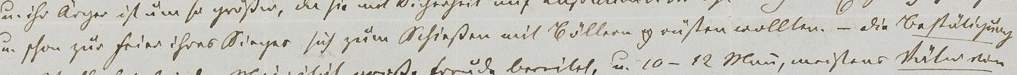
u. schon zur Feier ihres Sieges sich zum Schießen mit Böllern rüsten wollten. – Die Bestätigung
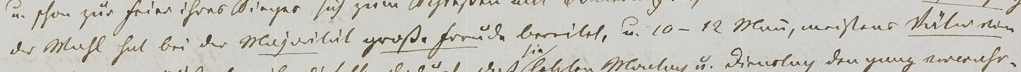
der Wahl hat bei der Majorität große Freude bereitet, u. 10-12 Mann, meistens Väter von
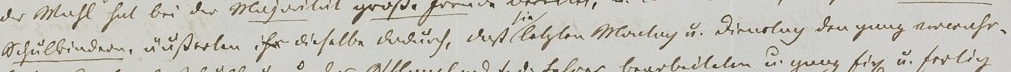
Schulkindern, äußerten dieselbe dadurch, daß sieletzten Montag u. Dienstag den ganz verwahr-
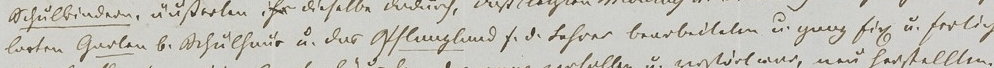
losten Garten b. Schulhaus u. das Pflanzland f. d. Lehrer bearbeiteten u. ganz fix u. fertig
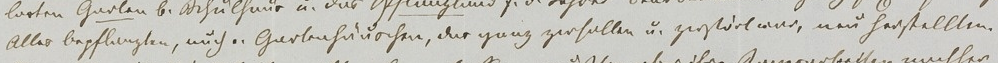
Alles bepflanzten, auch e. Gartenhäuschen, das ganz zerfallen u. zerstört war, neu herstellten.
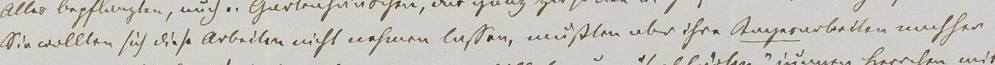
Sie wollten sich diese Arbeiten nicht nehmen lassen, mußten aber ihre Tagesarbeiten nachher
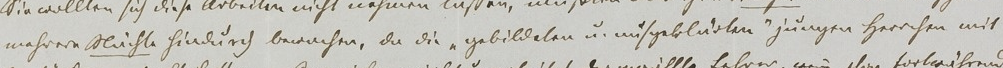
mehrere Nächte hindurch bewachen, da die «gebildeten u. aufgeklärten» jungen Herrchen mit
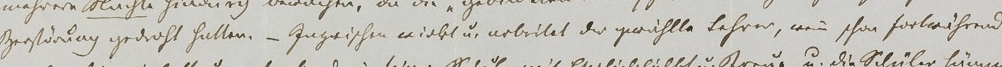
Zerstörung gedroht hatten. – Inzwischen wirkt u. arbeitet der gewählte Lehrer, wenn schon fortwährend
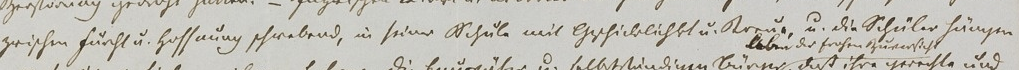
zwischen Furcht u. Hoffnung schwebend, in seiner Schule mit Geschicklichkt u. Treue, u. die Schüler hängen
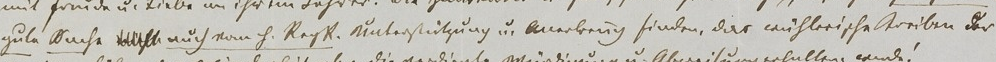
gute Sache ... auch vom h. RegR. Unterstützung u. Anerkennung finden, das wühlerische Treiben der
